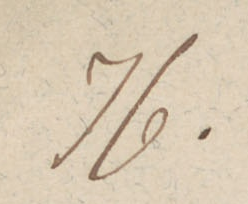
76.
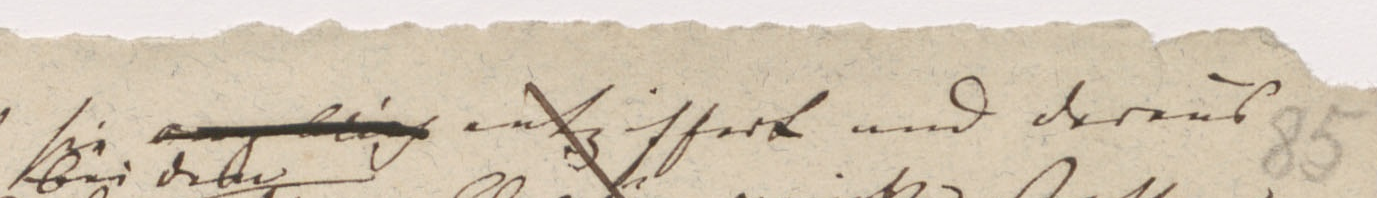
sie angeblich entziffert und daraus
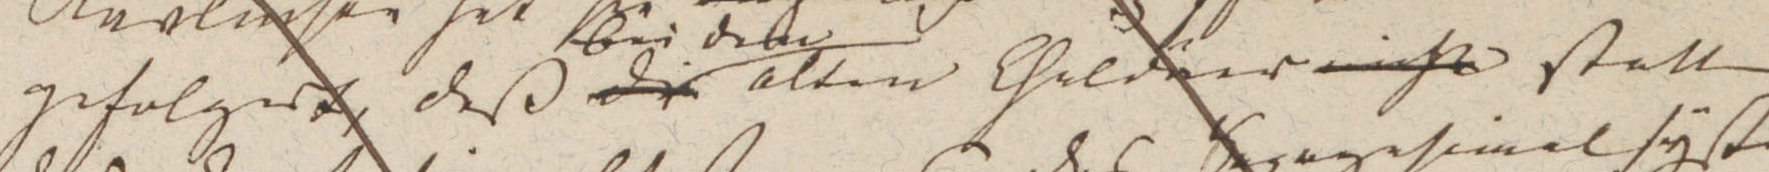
gefoldert,dass die bei dem alten Chaldäer nicht statt
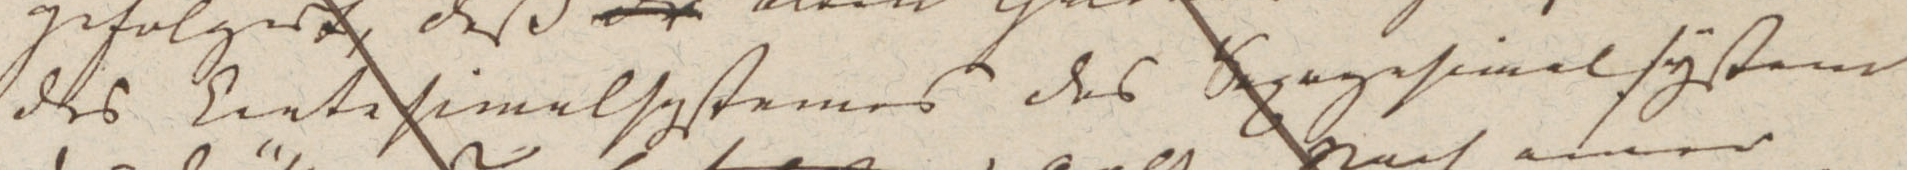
des Centesimalsystemes das Sexagesimalsystem
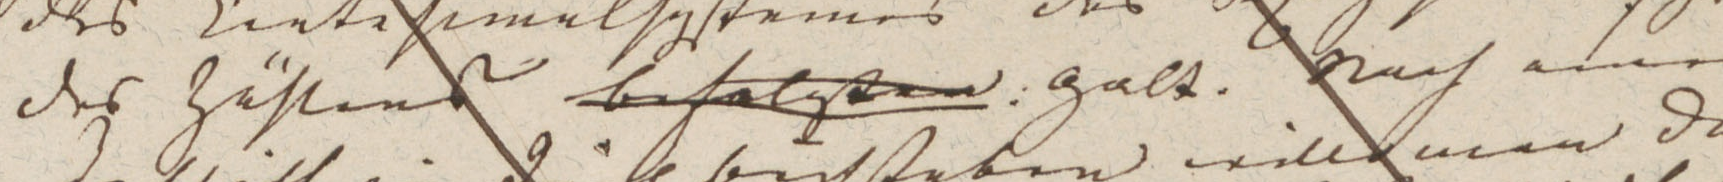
des Zählens befolgten. galt. Nach einer
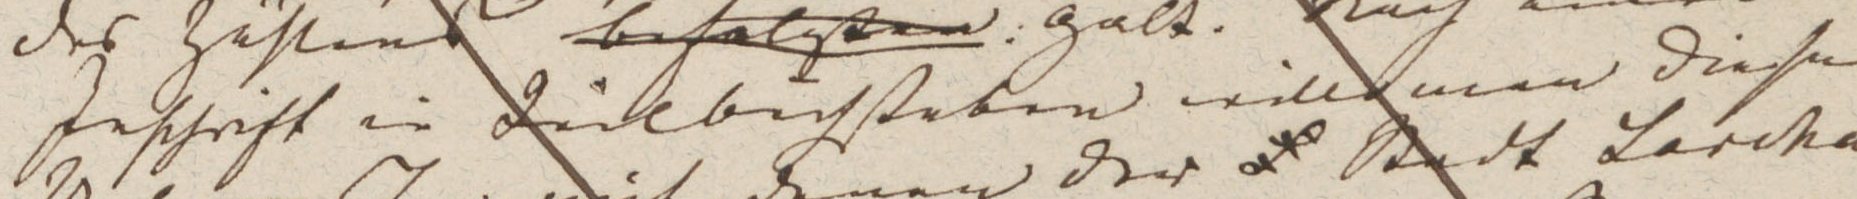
Inschrift in Keilbuchstaben will man diese
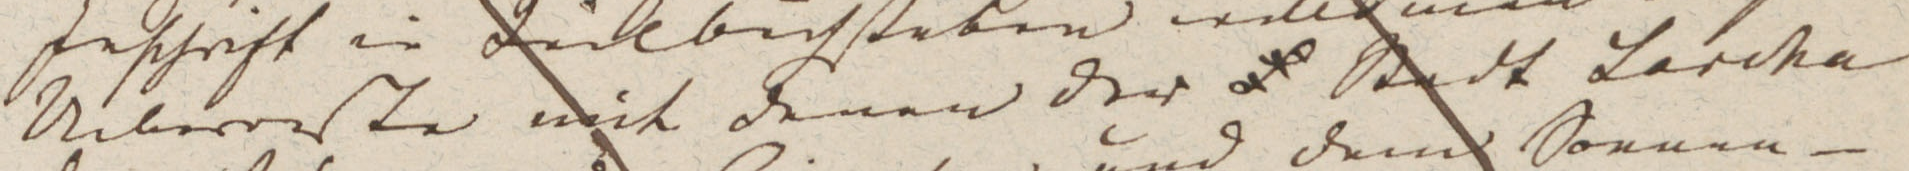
Ueberrreste mit denen der L Stadt Larcha
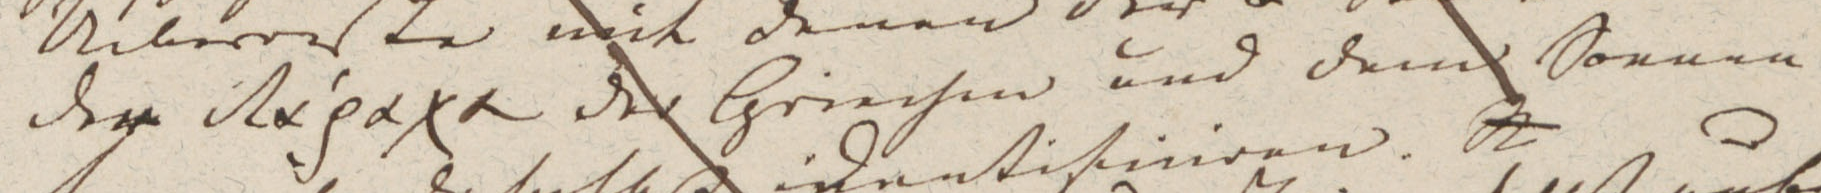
der λάραχα der Griechen und dem Sonnen-
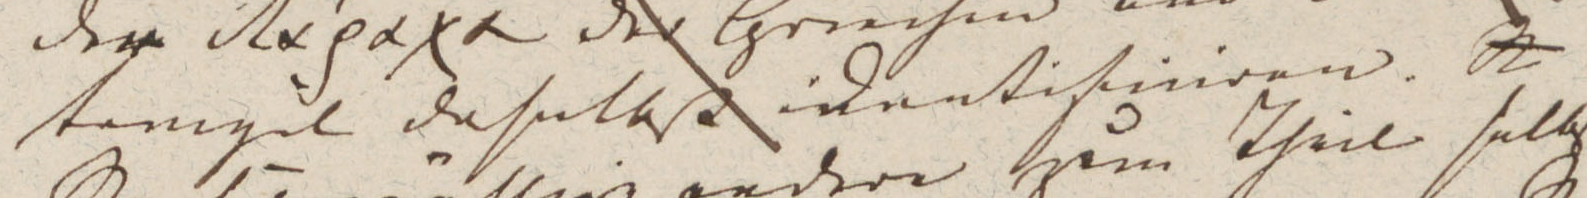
tempel daselbst identificiiren. N
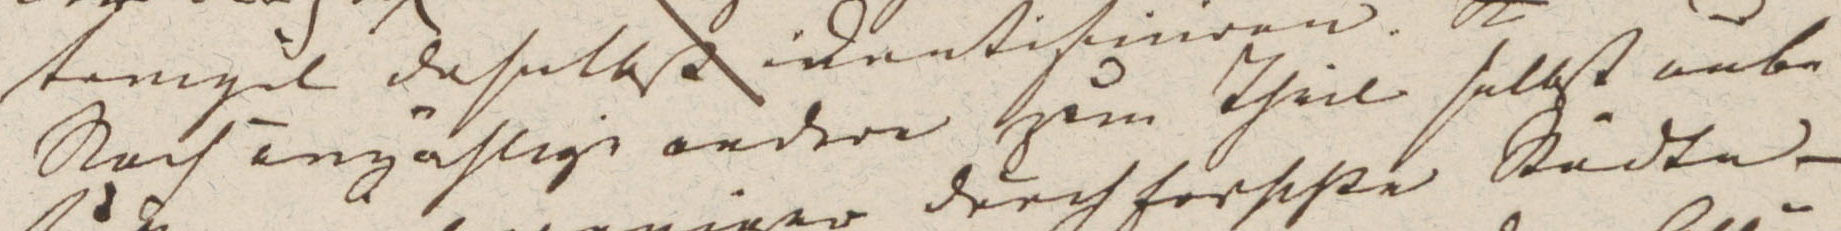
Noch unzählige andere zum Theil selbst unbe-
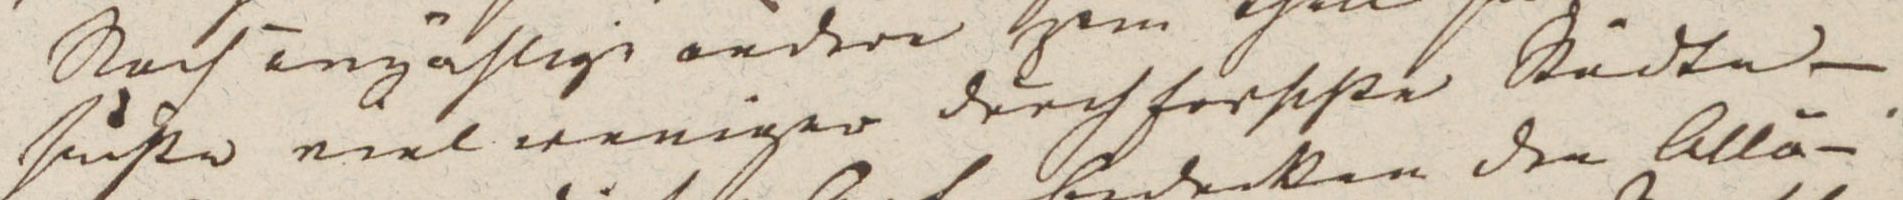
suchte viel weniger durchforschte Städte-
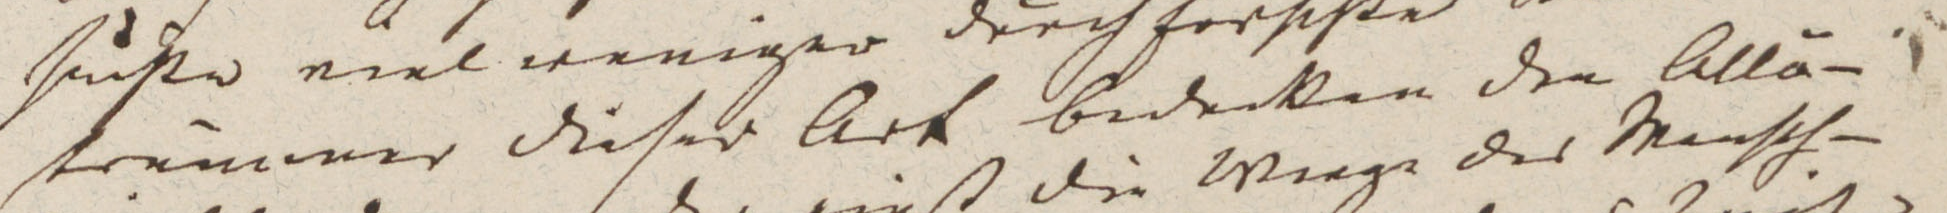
trümmer dieser Art bedecken den Allu-
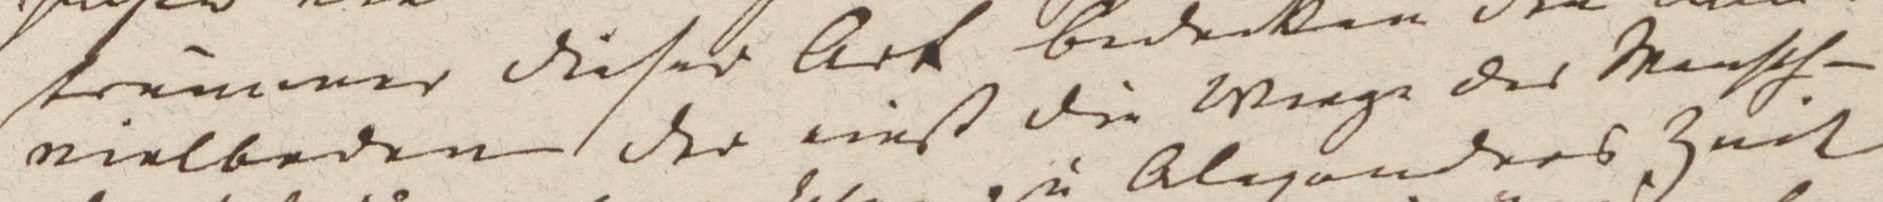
vialboden der einst die Wiege der Mensch-
